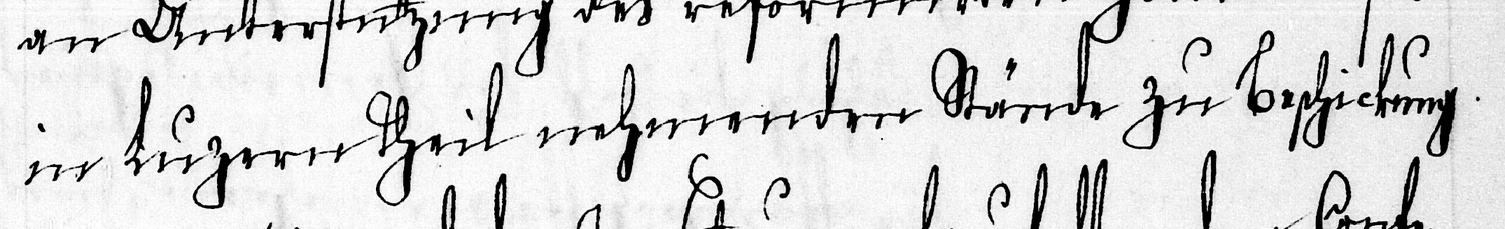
in Luzern Theil nehmenden Stände zu Beschickung
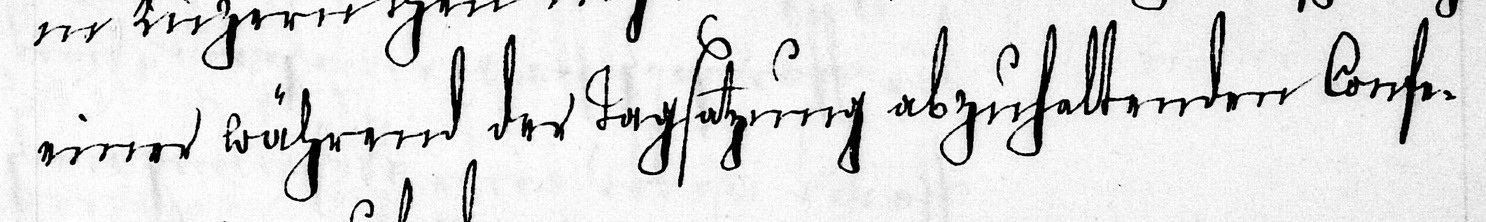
einer während der Tagsatzung abzuhaltenden Confe¬
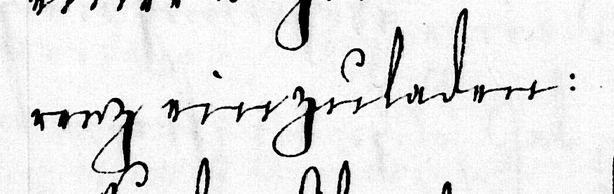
renz einzuladen:
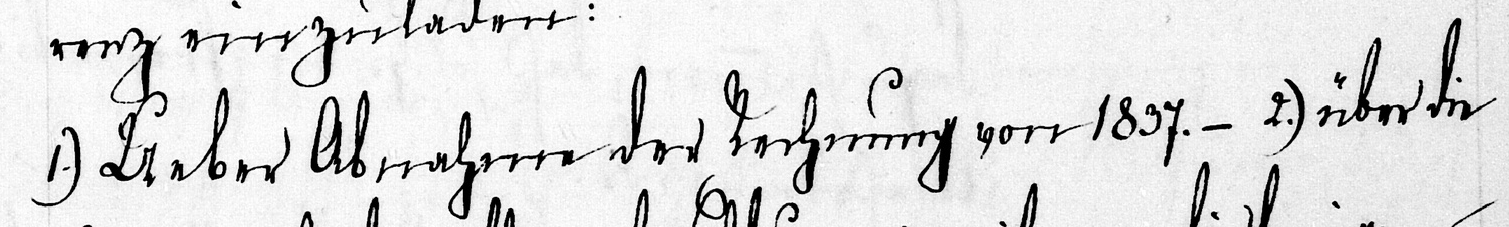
1.) Ueber Abnahme der Rechnung von 1837. – 2.) über die
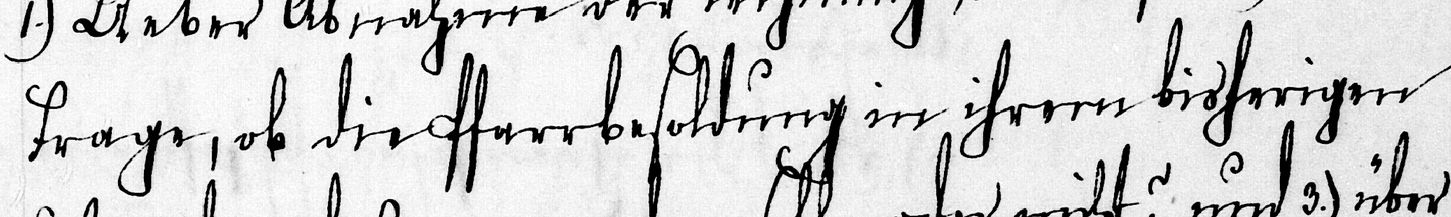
Frage, ob die Pfarrbesoldung in ihrem bisherigen
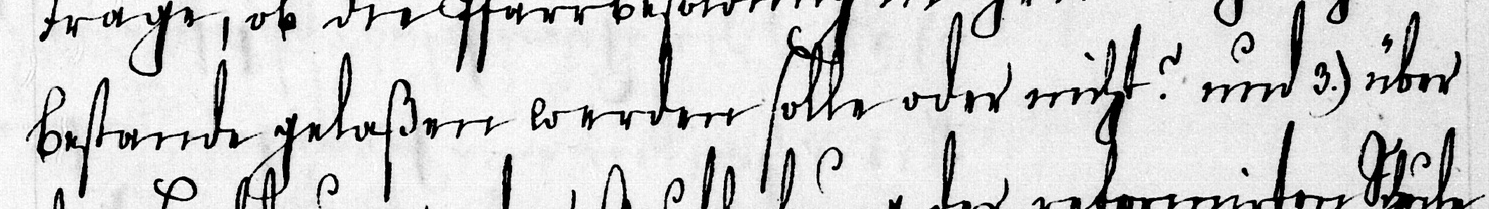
Bestande gelaßen werden solle oder nicht? und 3.) über
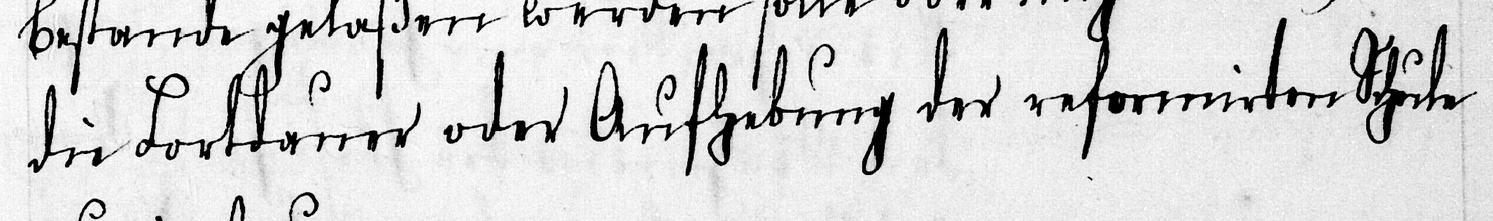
die Fortdauer oder Aufhebung der reformirten Schu¬
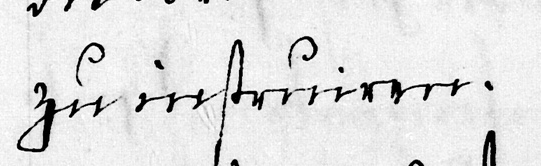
zu instruiren.
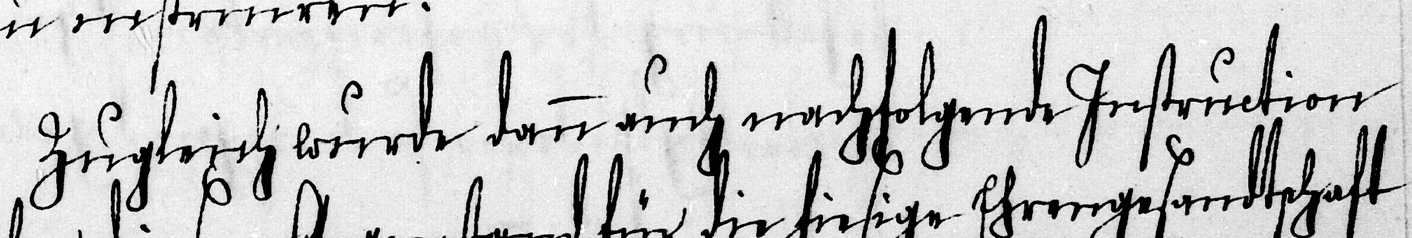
Zugleich wurde dann auch nachfolgende
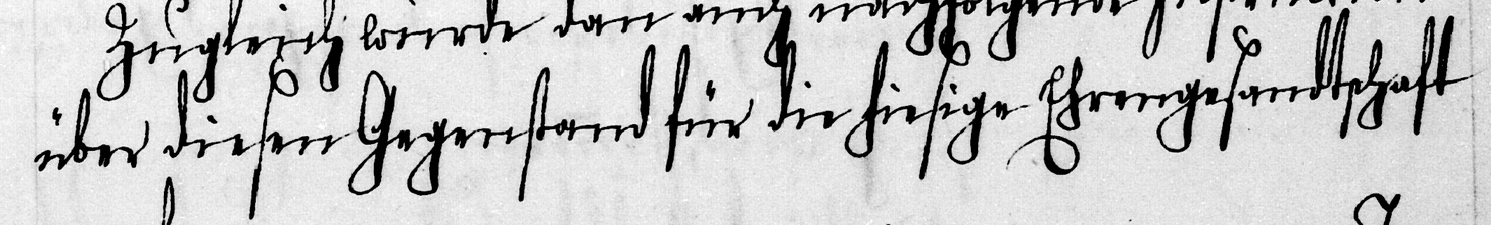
über diesen Gegenstand für die hiesige Ehrengesandtschaft
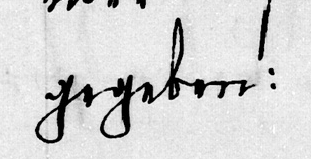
gegeben:
